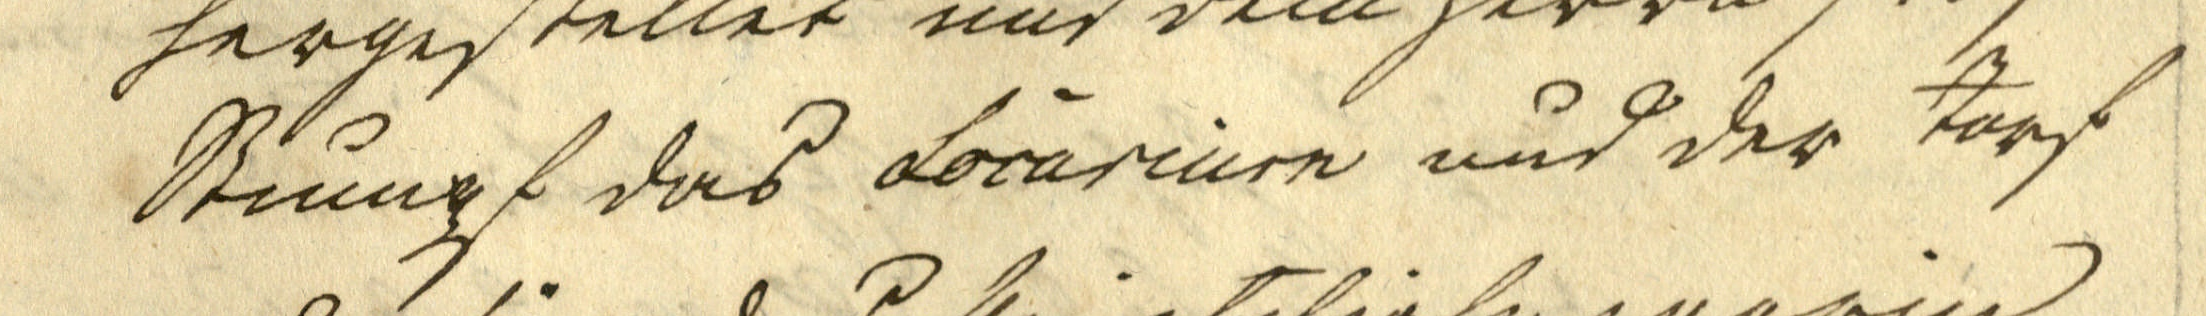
Stumpf das Locarium und der Torf
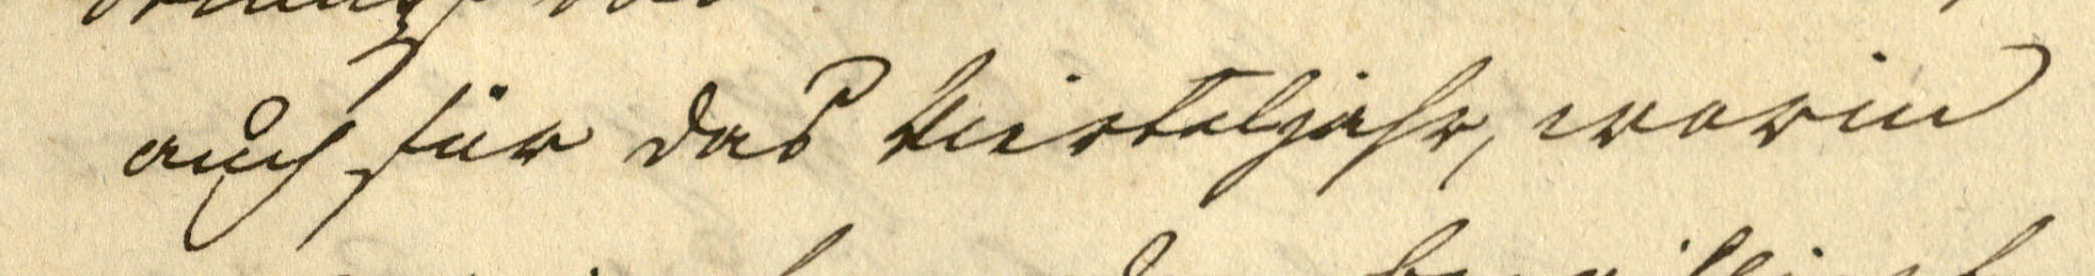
auch für das Vierteljahr, worin
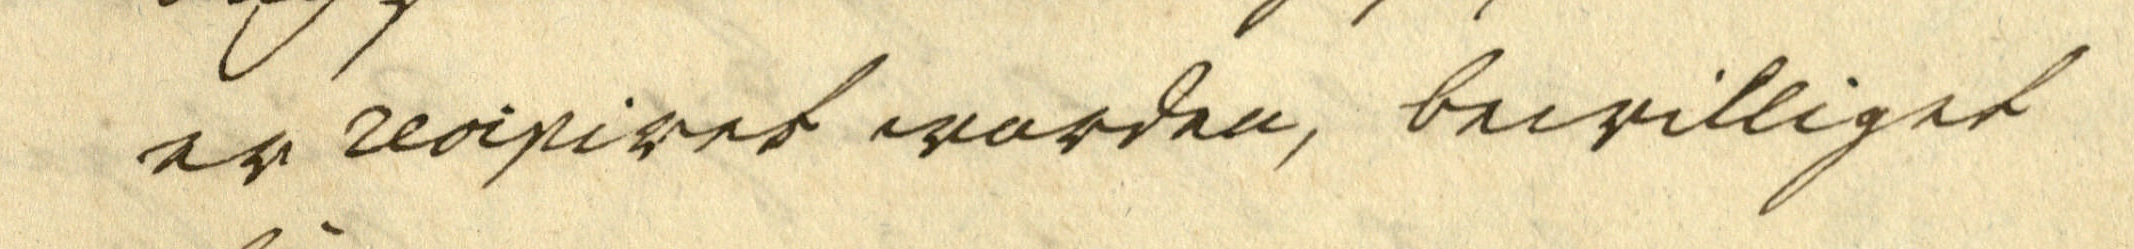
er recipiret worden, bewilliget
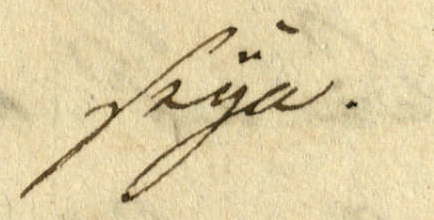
seÿn.
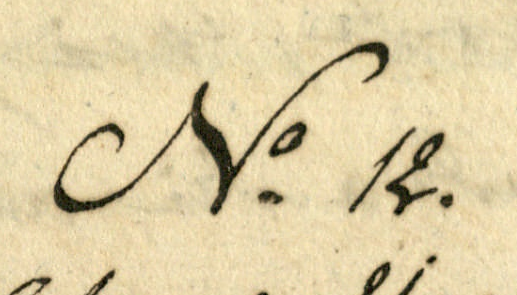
No 12.
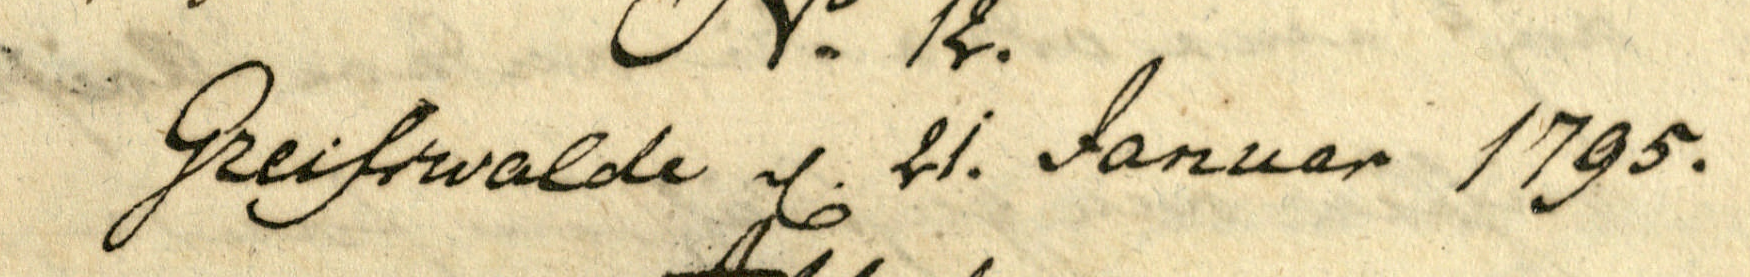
Greifswalde d. 4. Januar 1795.
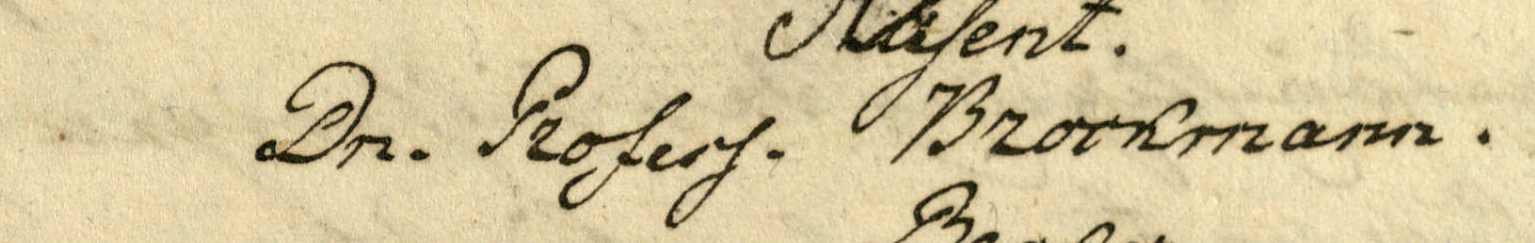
Dn. Profess. Brockmann.
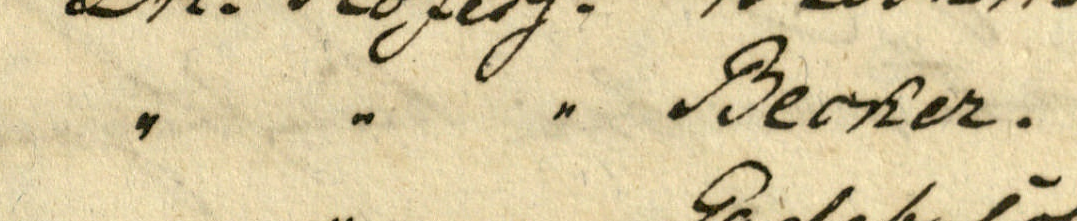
Becker.
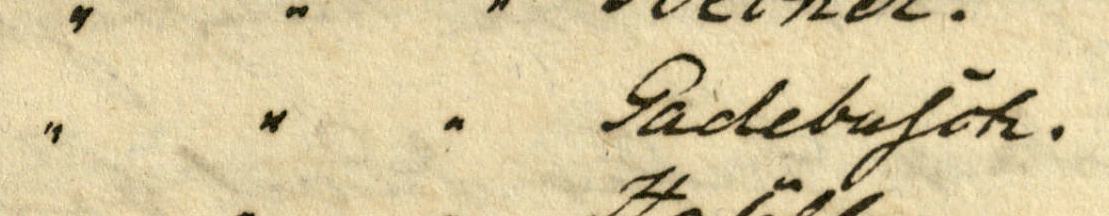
Gadebusch.
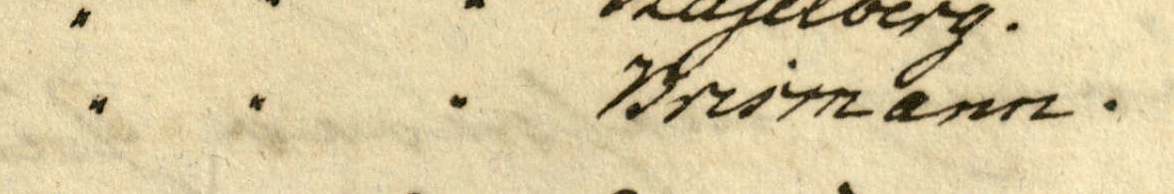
Brismann.
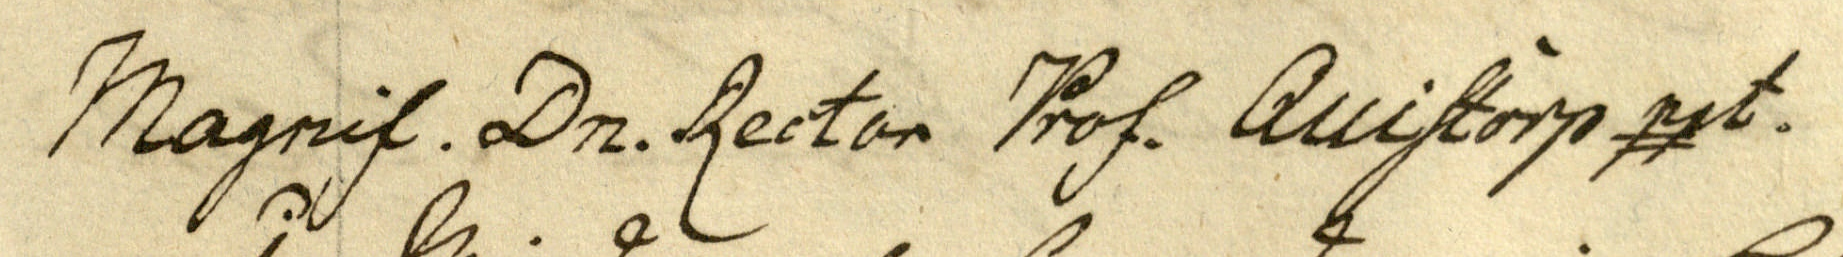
Magnif. Dn. Rector Prof. Quistorp ppt.
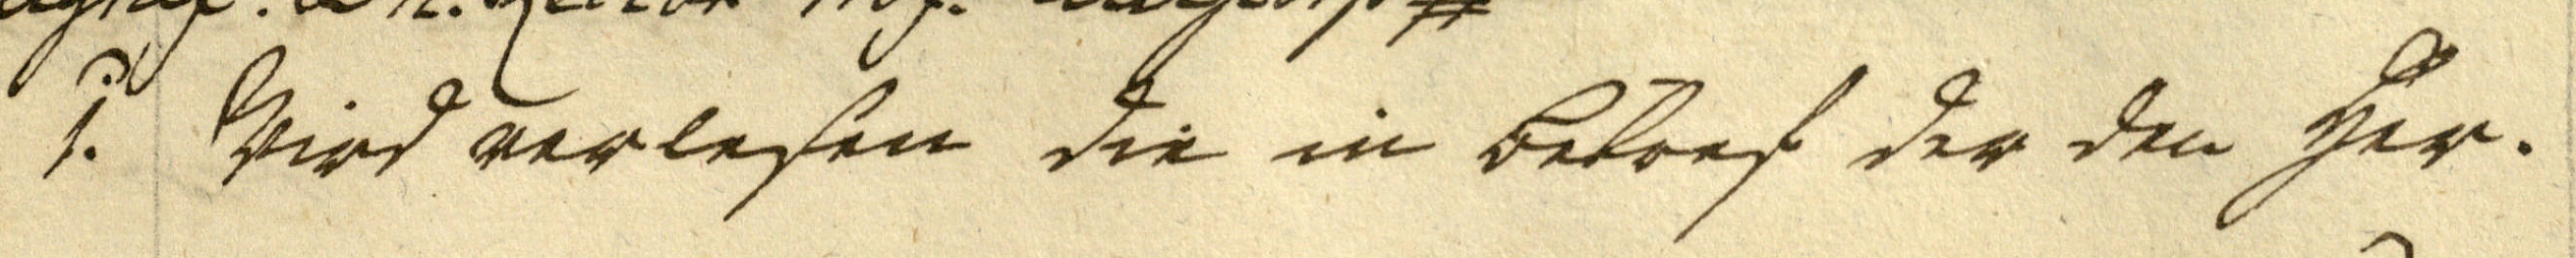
1. Wird verlesen die in Betref der den Her¬
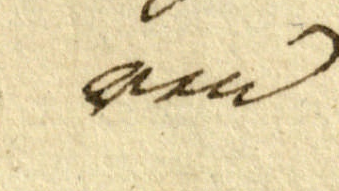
ren
